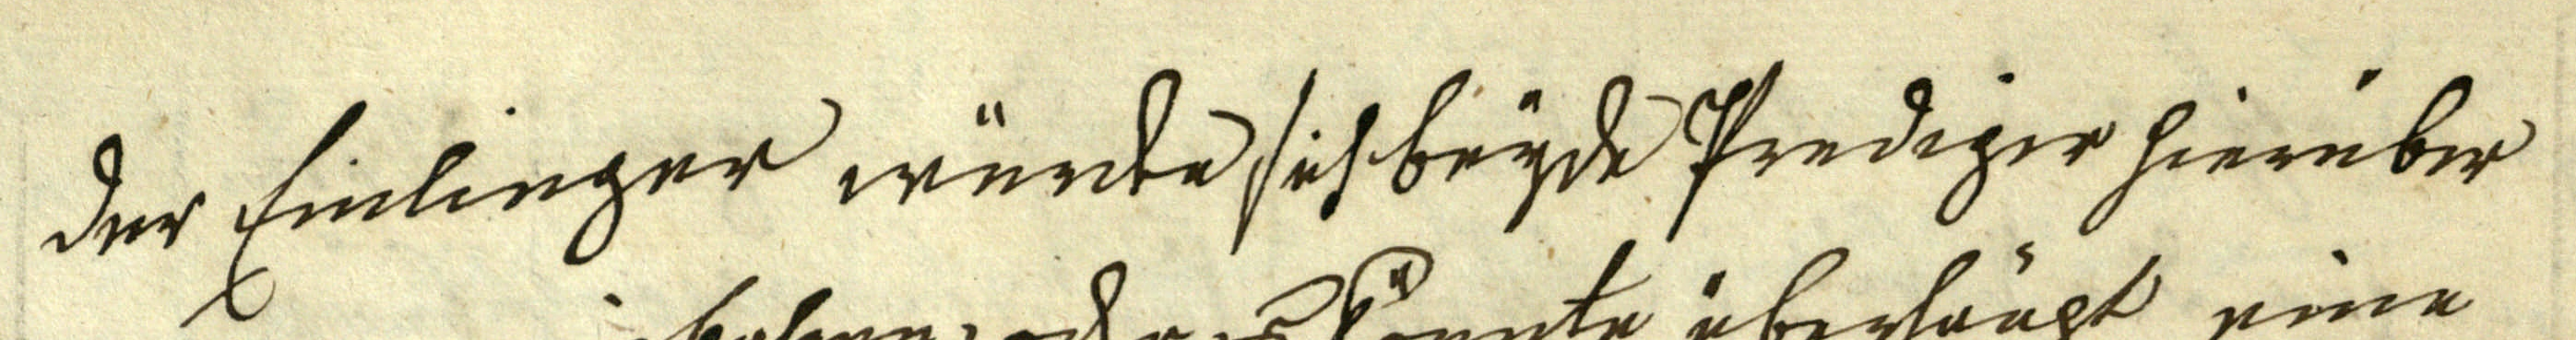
der Einlieger würden sich beÿde Prediger hierüber
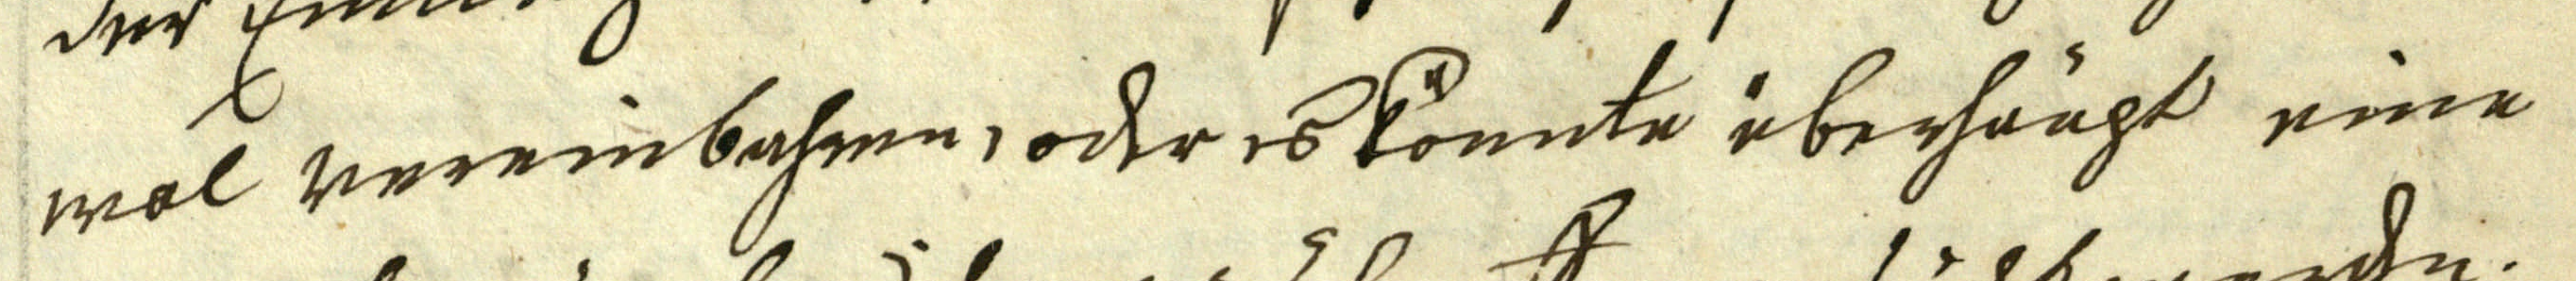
wol vereinbahren, oder es könnte überhaupt eine
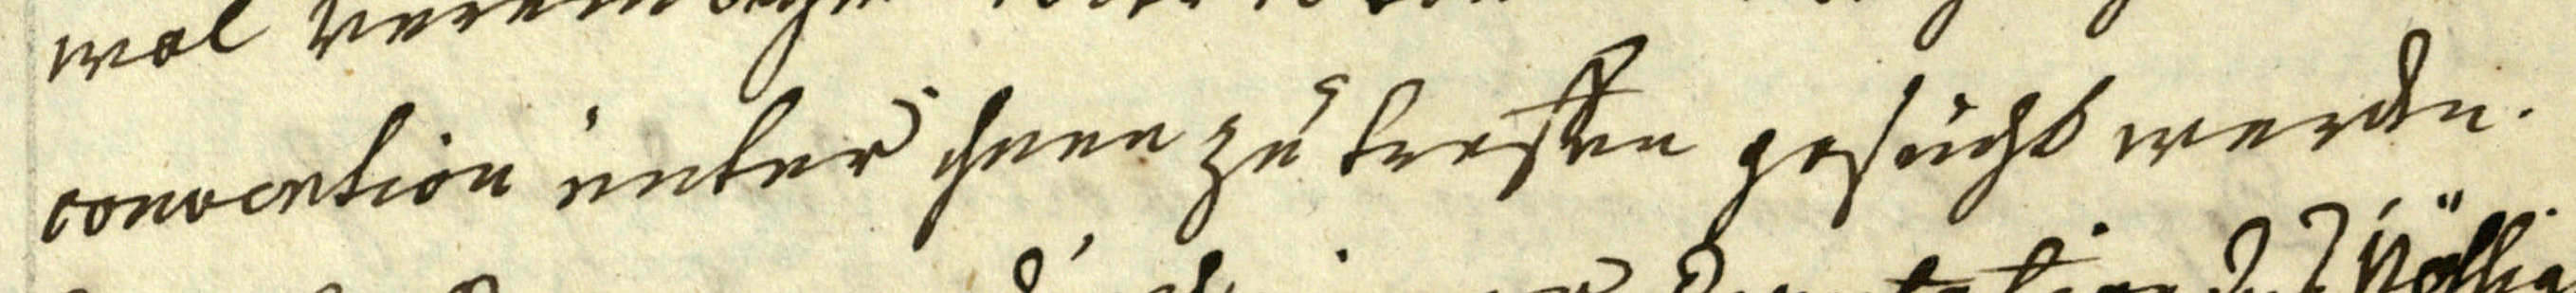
convention unter ihnen zu treffen gesucht werden.
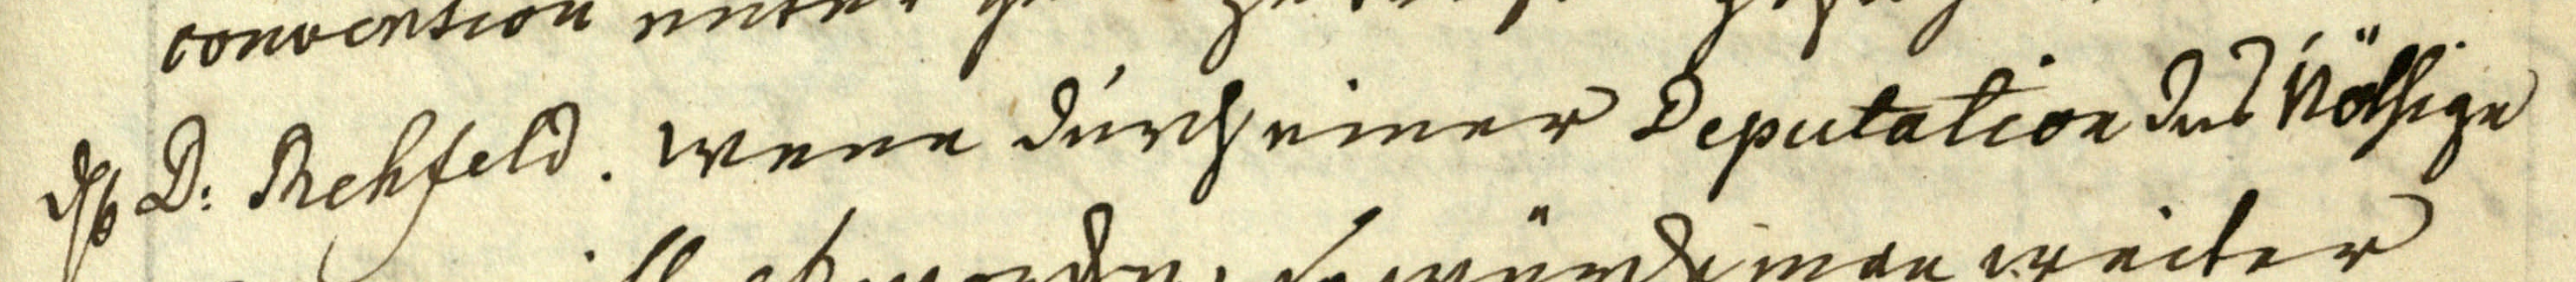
dh. D. Rehfeld. wenn durch einer Deputation das Nöthige
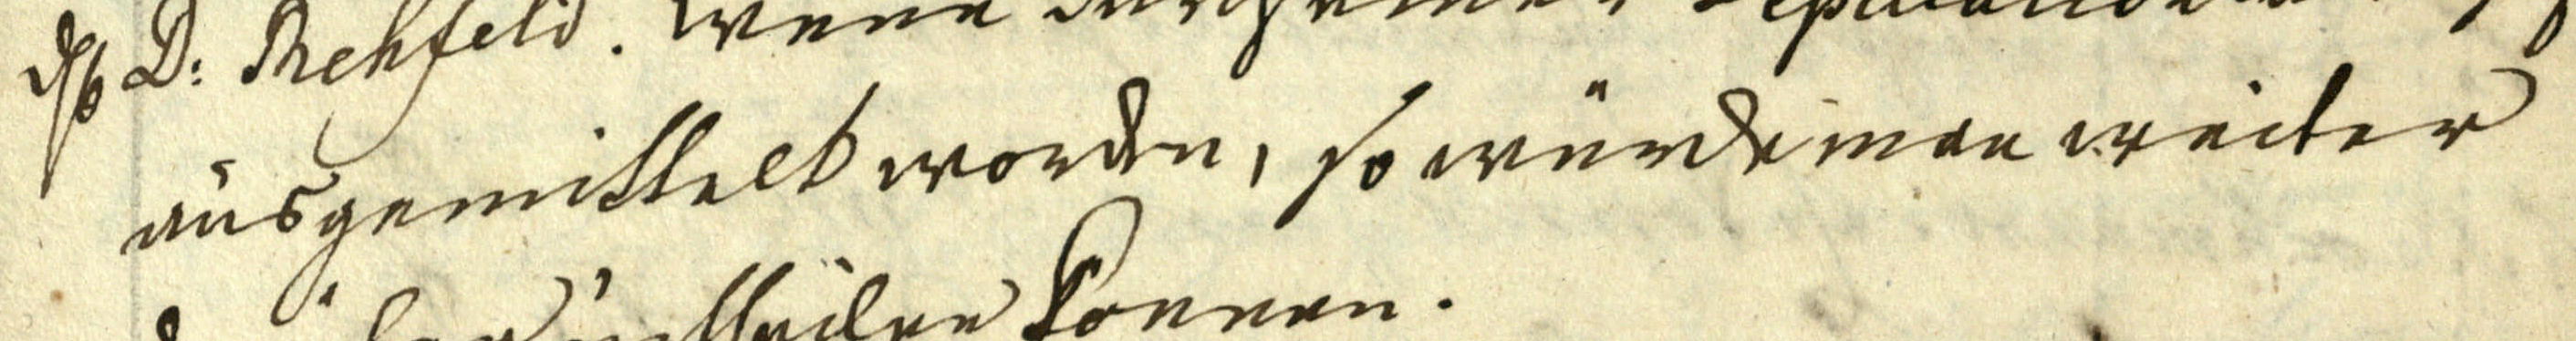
ausgemittelt worden, so würde man weiter
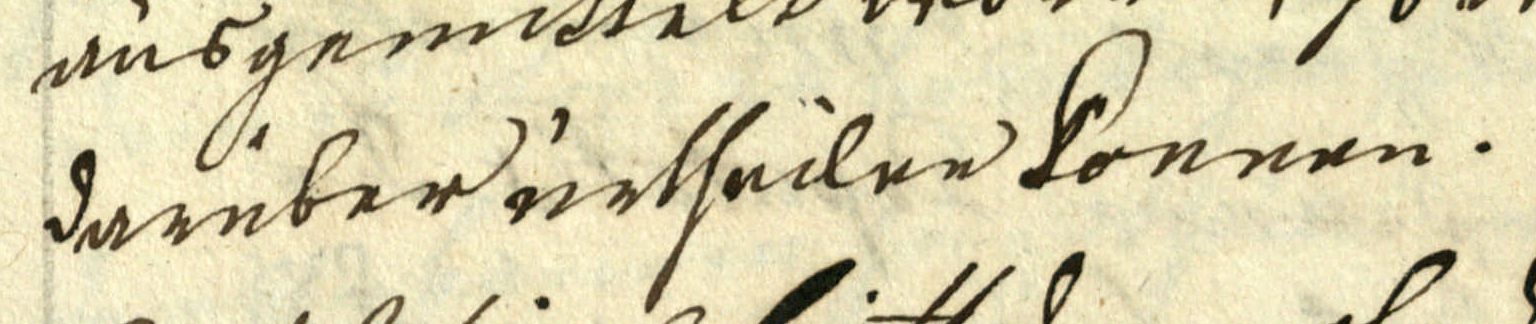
darüber urtheilen können.
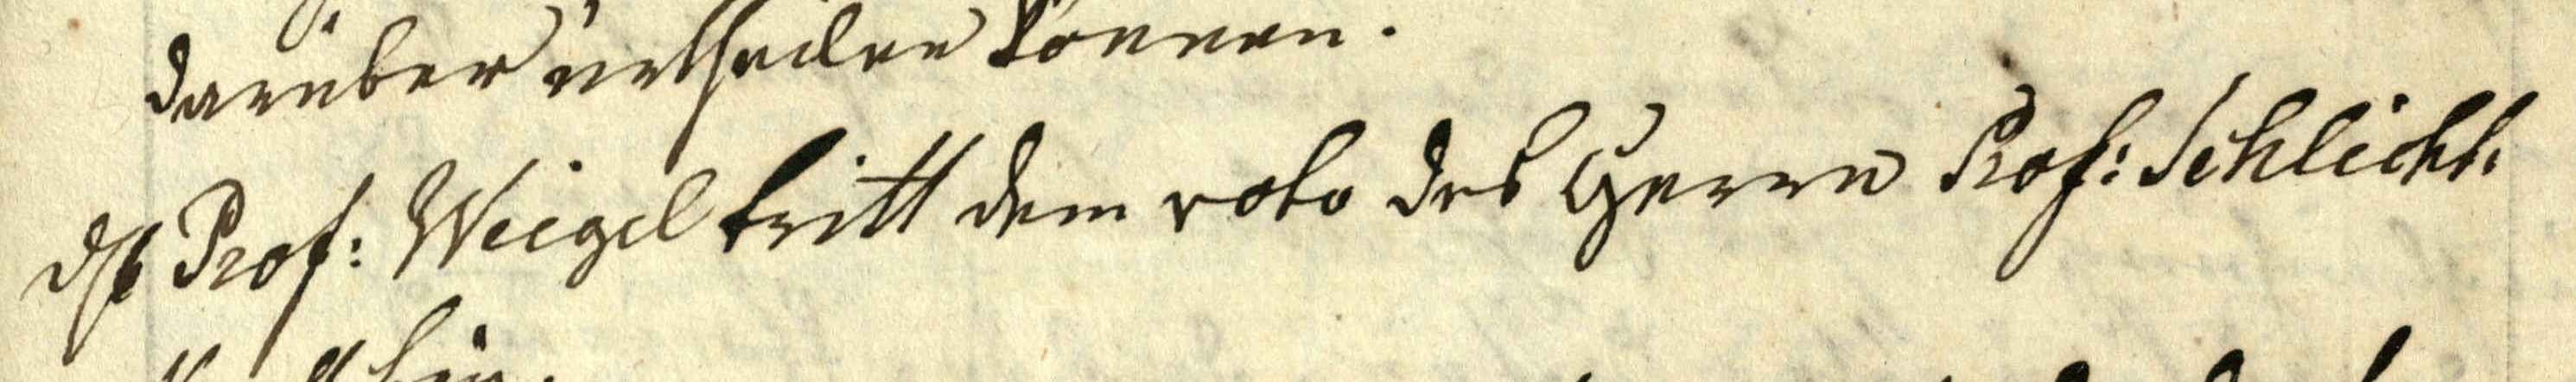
dh Prof. Weigel tritt dem voto des Herrn Prof Schlicht¬
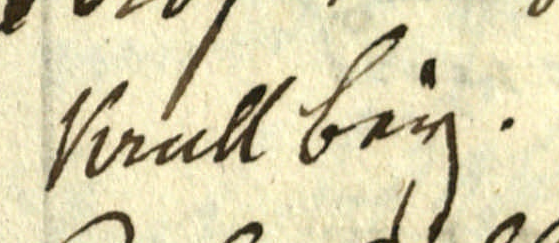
krull beÿ.
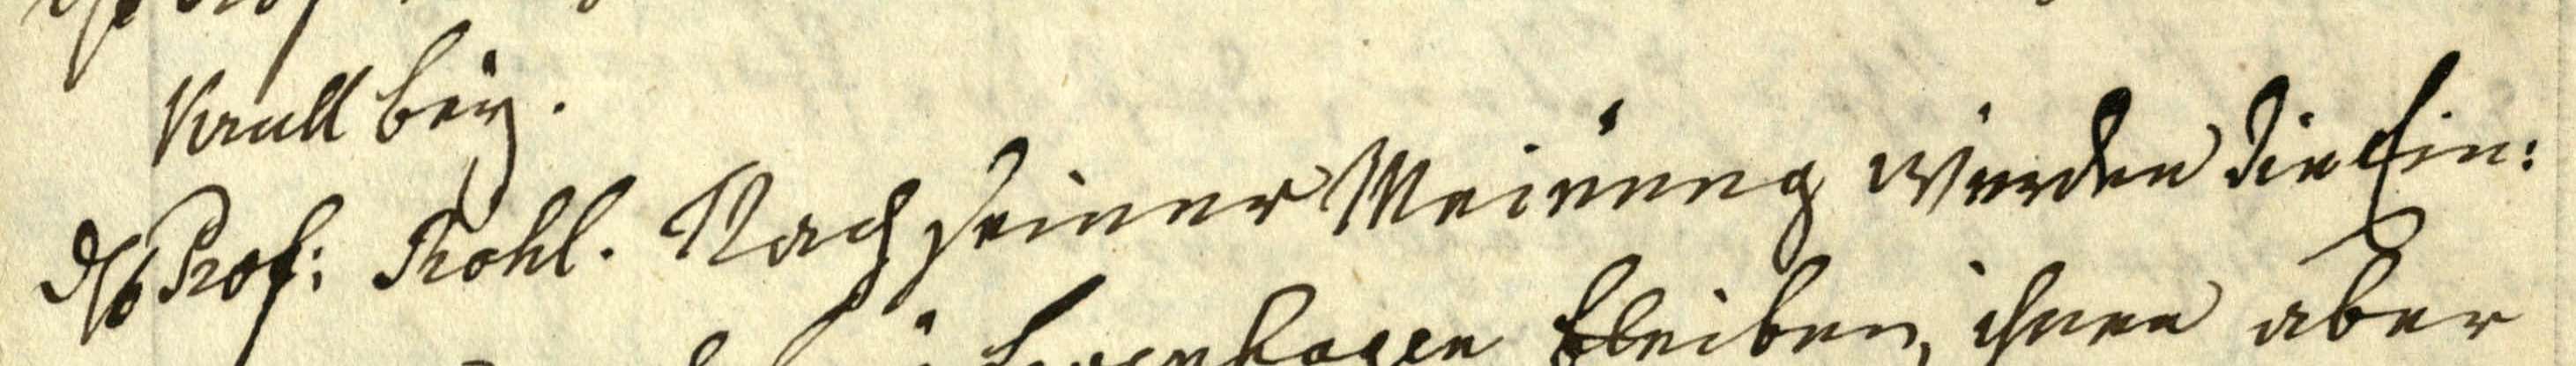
dh Prof. Röhl. Nach seiner Meinung würden die Ein¬
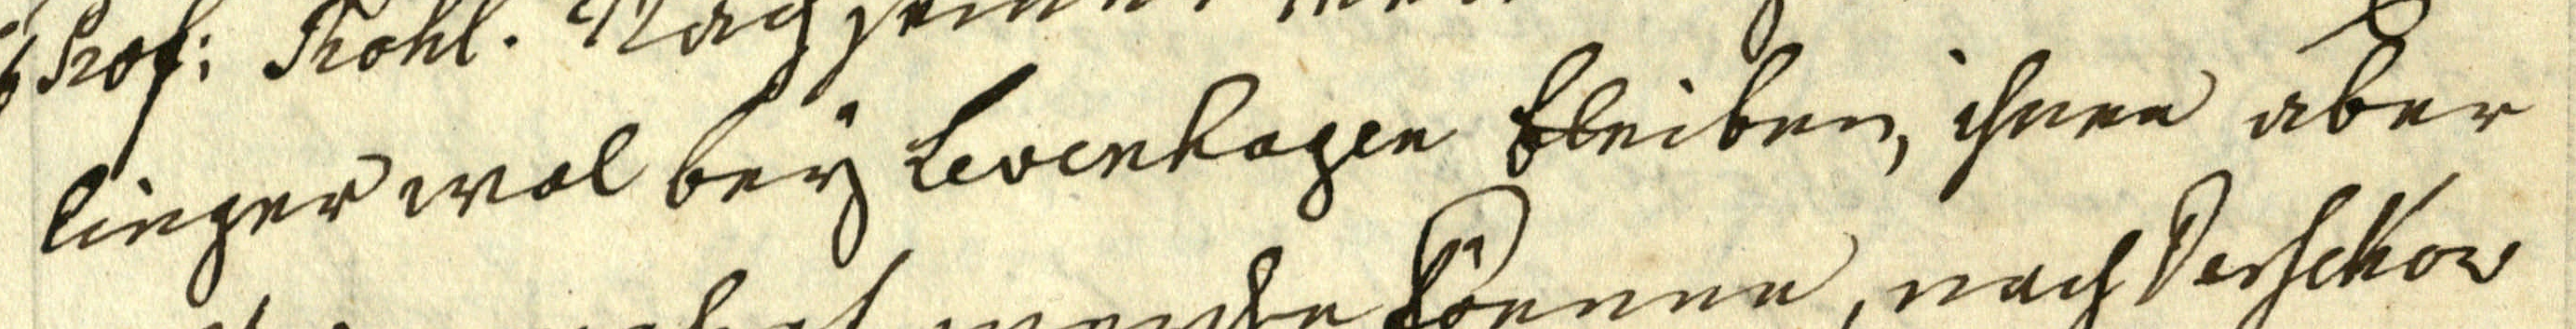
lieger wol beÿ Levenhagen bleiben, ihnen aber
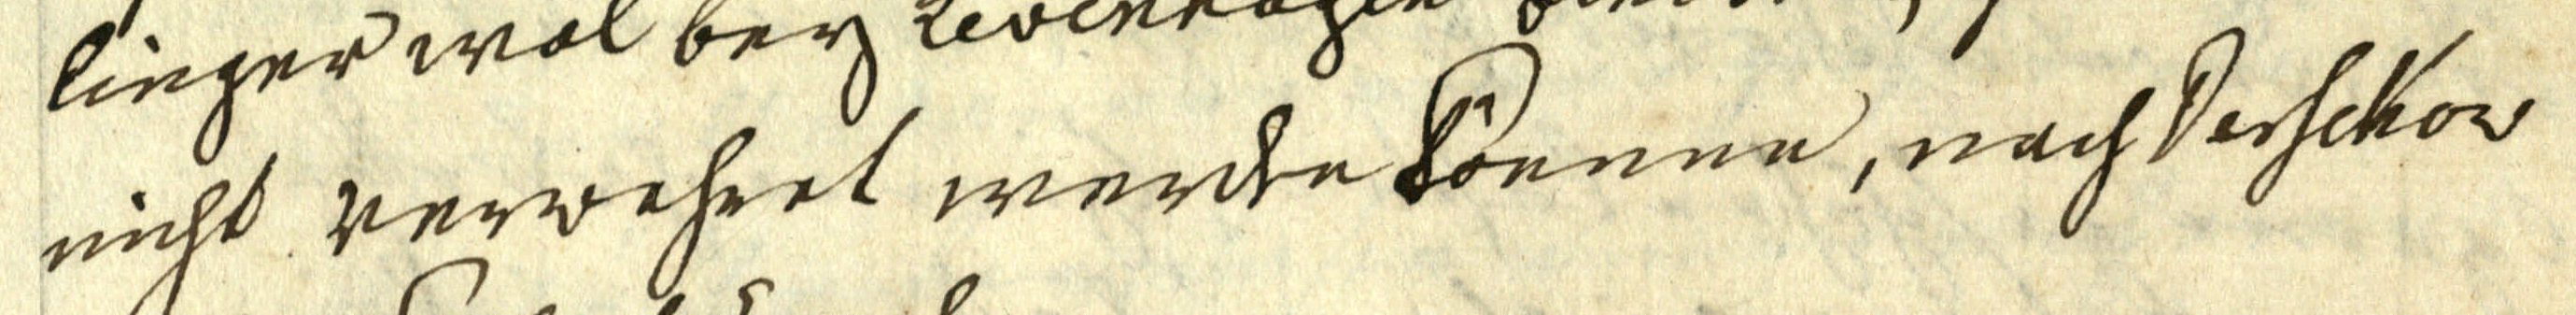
nicht verwehret werden können, nach Dersekow
